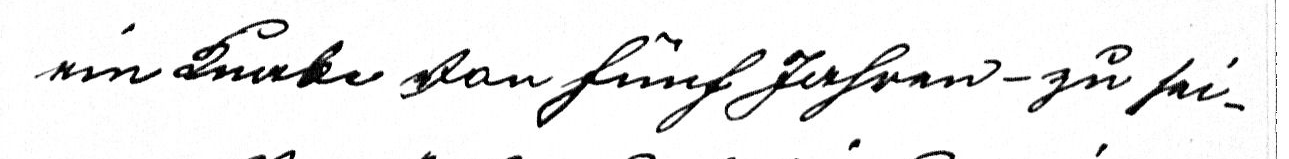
ein Knabe von fünf Jahren - zu sei¬
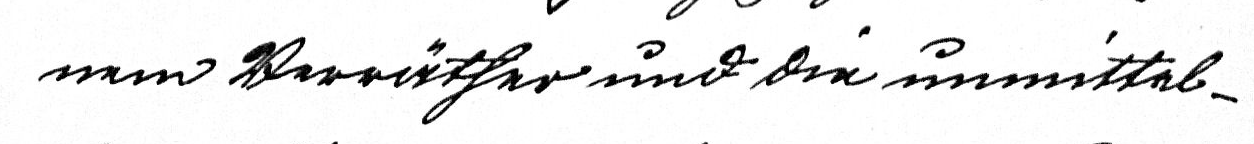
nem Verräther und die unmittel¬
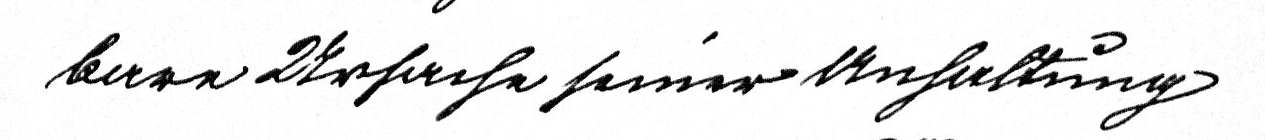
bare Ursache seiner Anhaltung
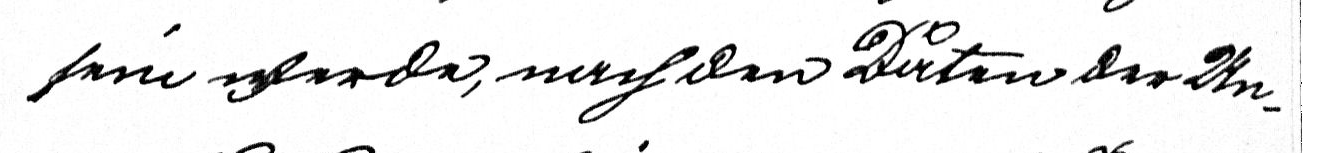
sein werde, nach den Daten der Un¬
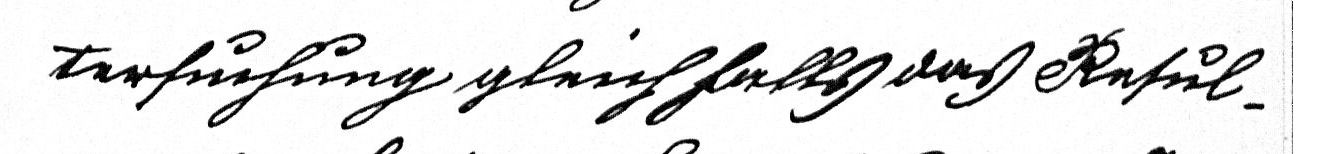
tersuchung gleich falls das Resul¬
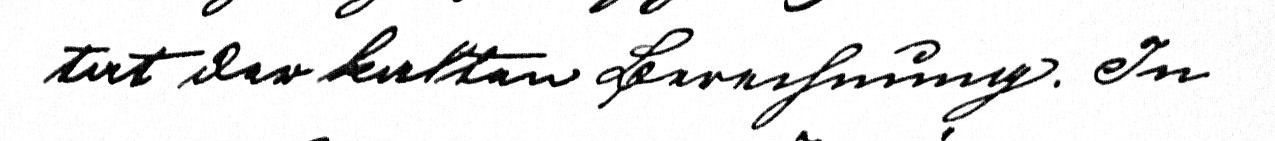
tat der kalten Berechnung. In
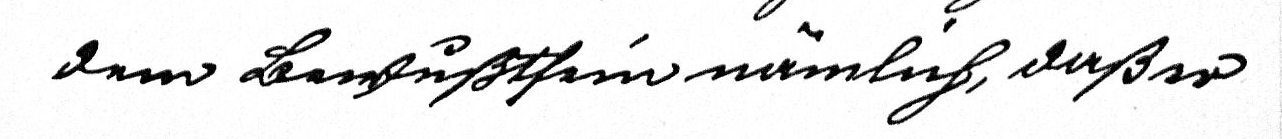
dem Bewußthein nämlich, daßer
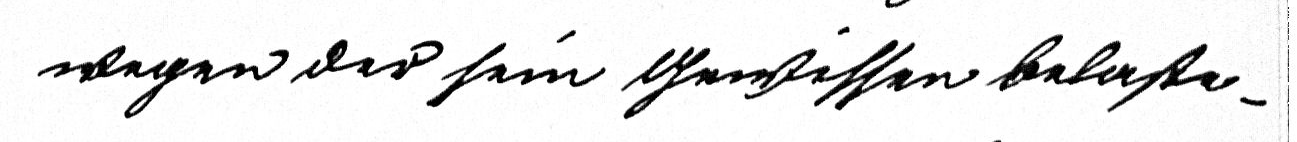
wegen der sein Gewissen belaste¬
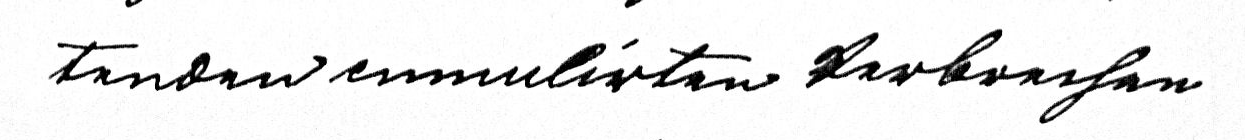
tenden cumulirten Verbrechen
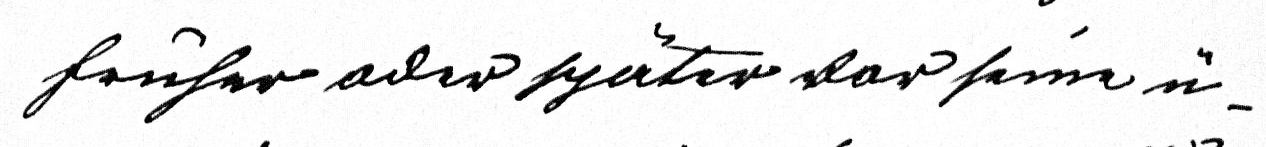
früher oder später vor seine ü¬
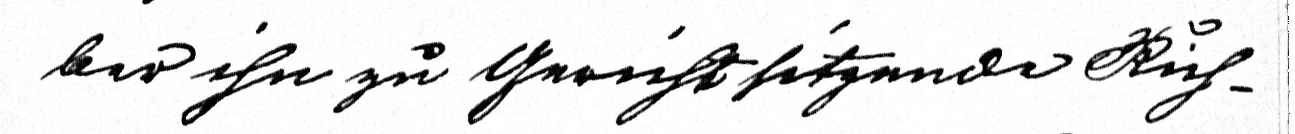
ber ihn zu Gericht sitzende Rich¬
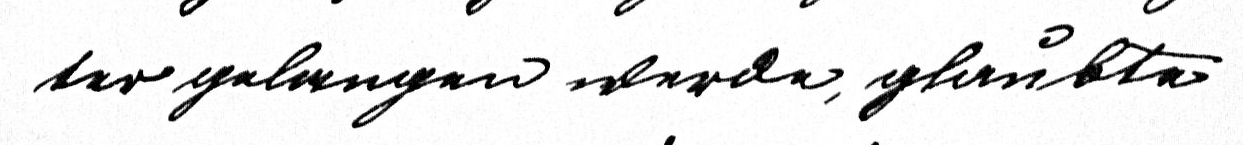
ter gelangen werde, glaubte
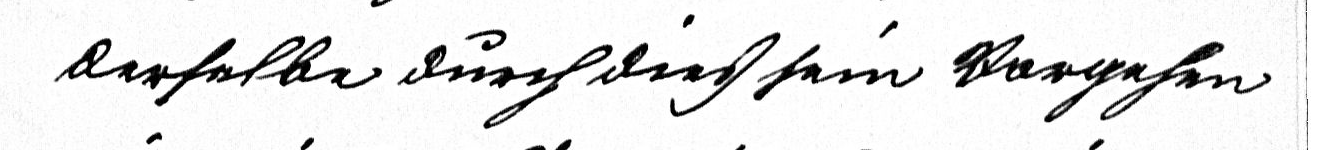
derselbe durch dies sein Vorgehen
